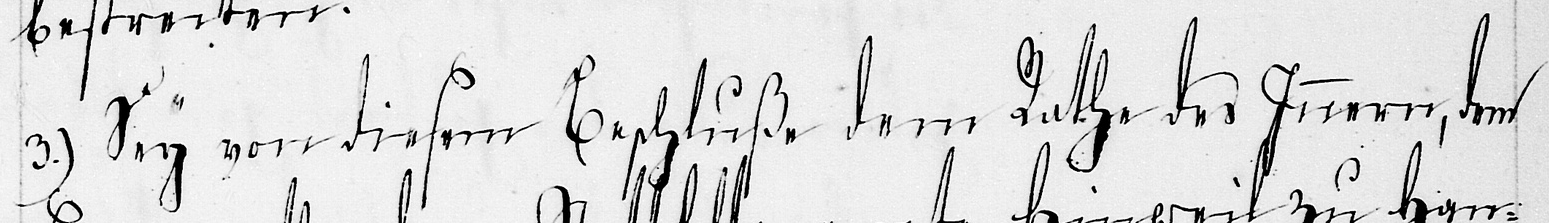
3.) Sey von diesem Beschluße dem Rathe des Innern, dem
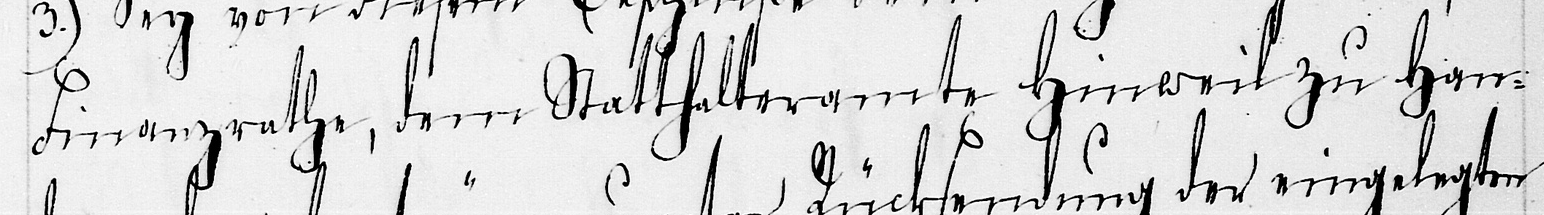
Finanzrathe, dem Statthalteramte Hinweil zu Han¬
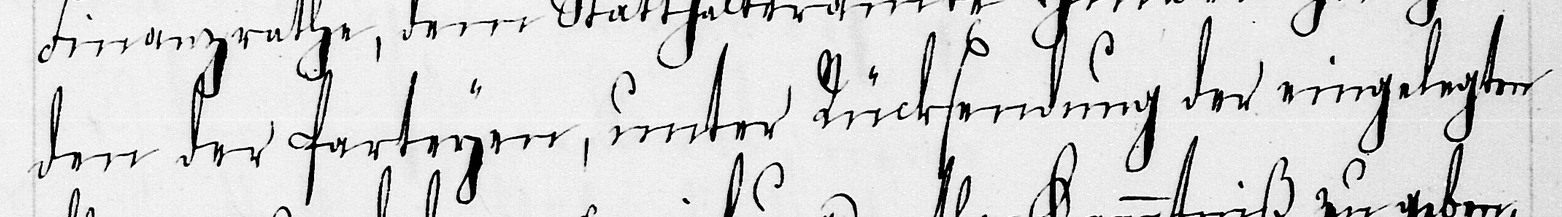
den der Parteyen, unter Rücksendung der eingelegten
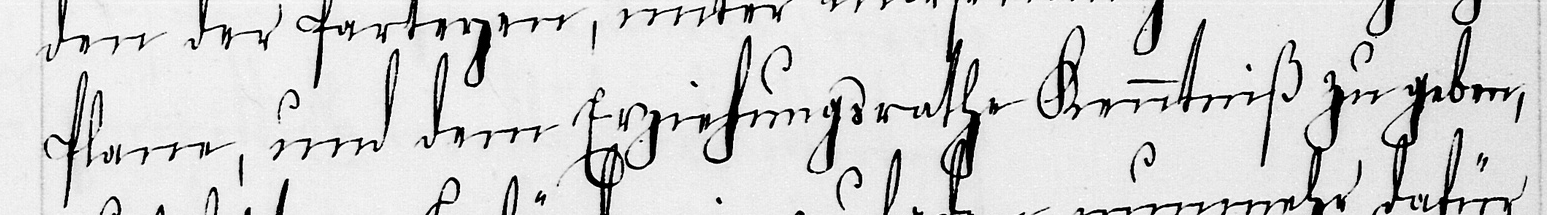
Plane, und dem Erziehungsrathe Kenntniß zu geben,
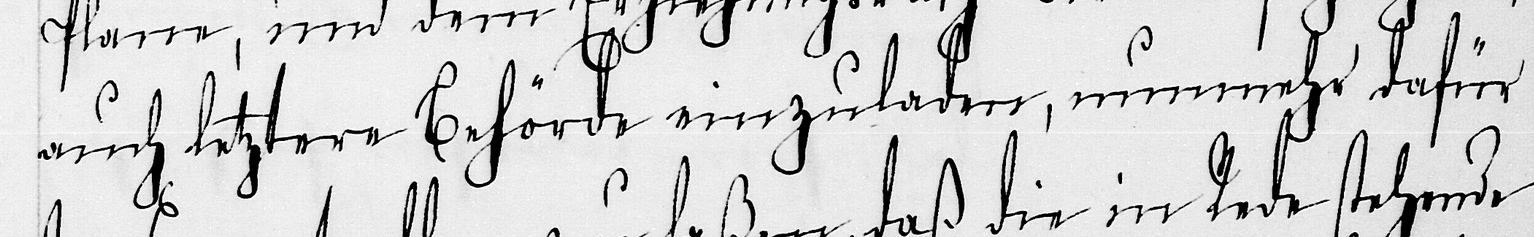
auch letztere Behörde einzuladen, nunmehr dafür
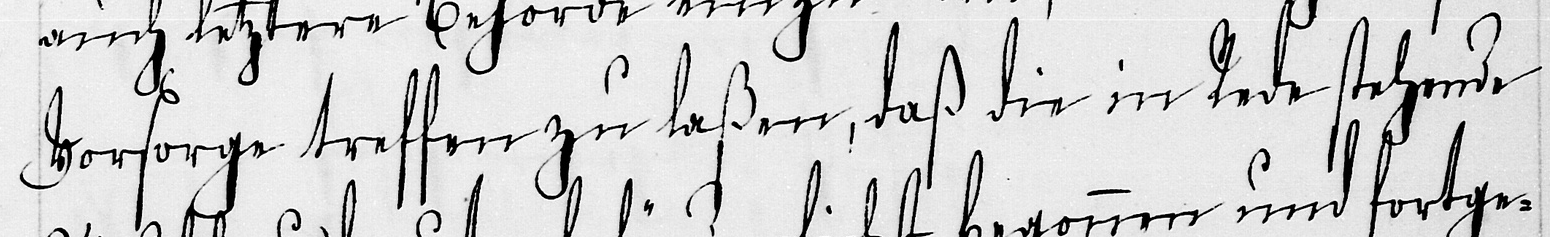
Vorsorge treffen zu laßen, daß die in Rede stehende
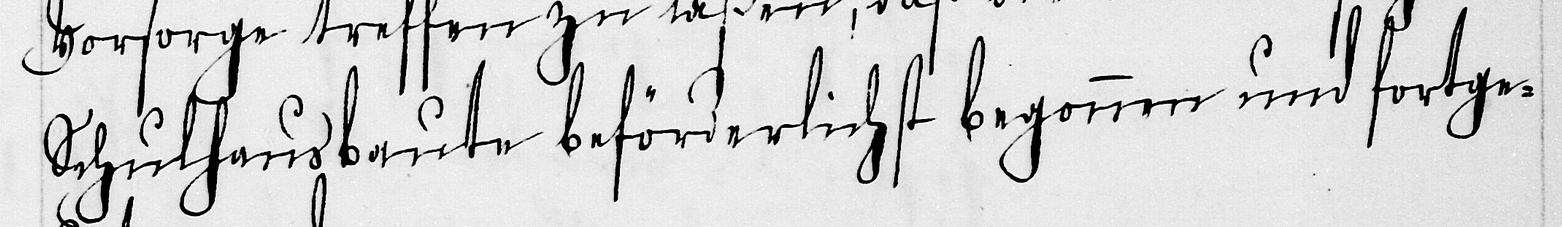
Schulhausbaute beförderlichst begonnen und fortge¬
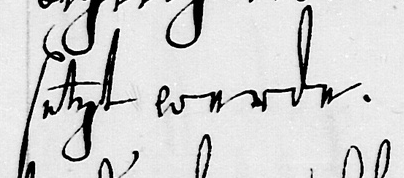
setzt werde.
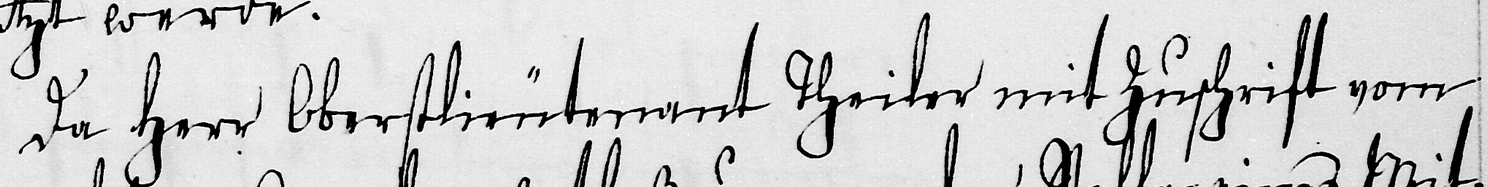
Da Herr Oberstlieutenant Theiler mit Zuschrift vom
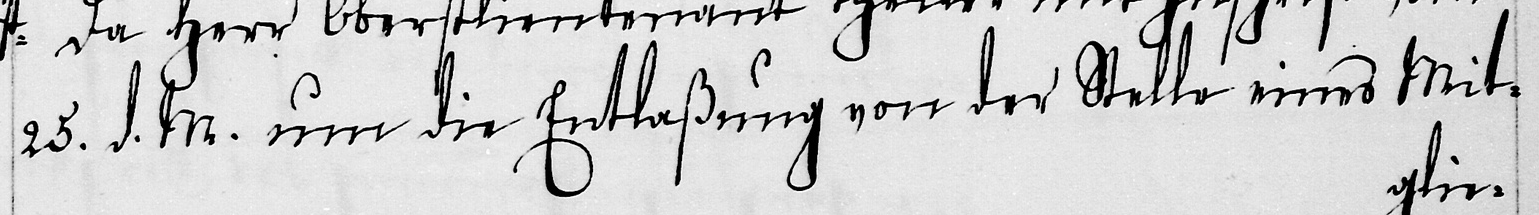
25. d. M. um die Entlaßung von der Stelle eines Mit-
